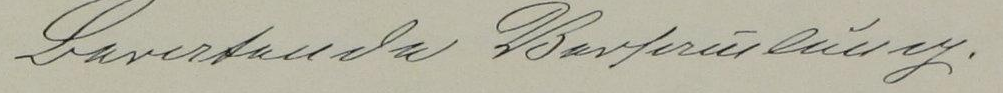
Beratende Versammlung.
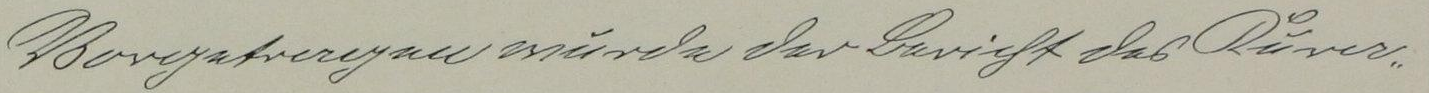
Vorgetragen wurde der Bericht des Kura-
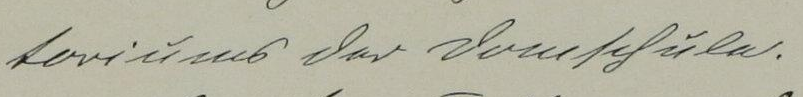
toriums der Domschule.
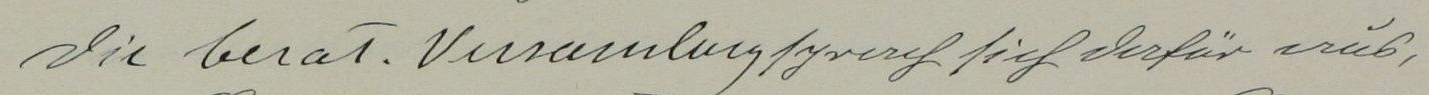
Die berat. Versammlung sprach sich dafür aus,
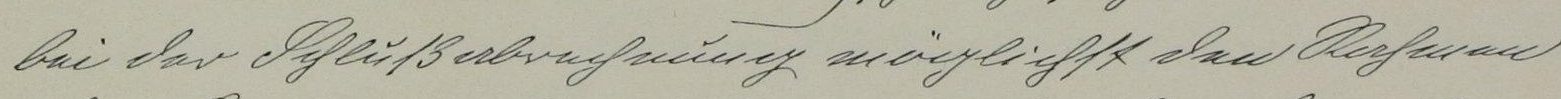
bei der Schlußabrechnung möglichst den Rahmen
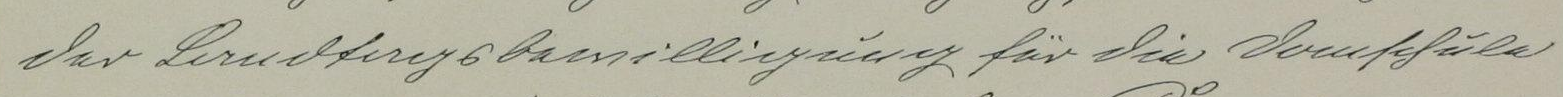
der Landtagsbewilligung für die Domschule
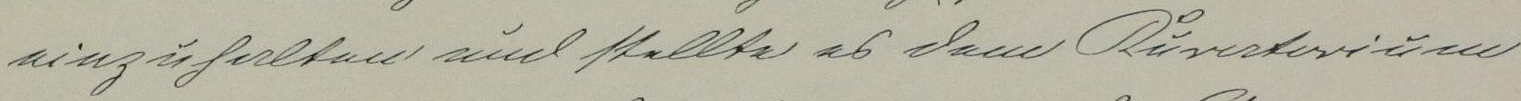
einzuhalten und stellte es dem Kuratorium
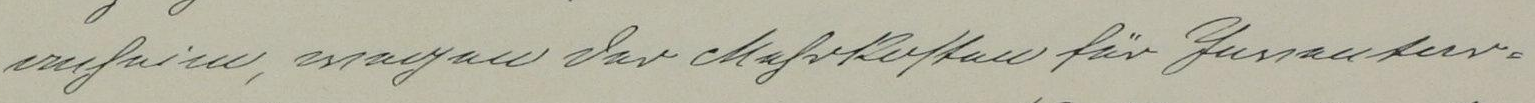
anheim, wegen der Mehrkosten für Inventar-
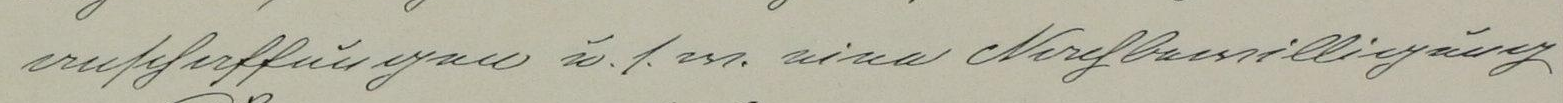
anschaffungen u.s.w. eine Nachbewilligung
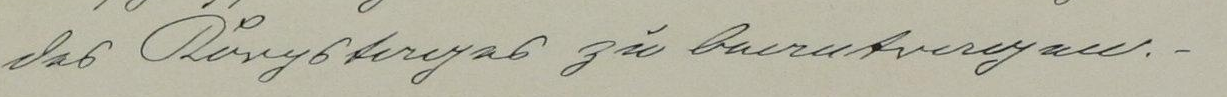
des Korpstages zu beantragen.
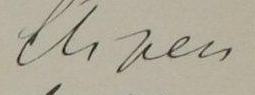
Stipen
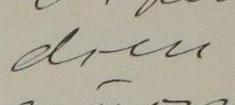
dien
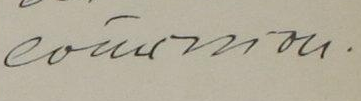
commission
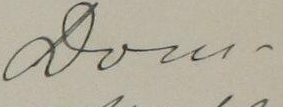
Dom-
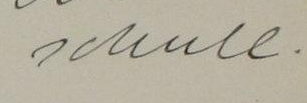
schule
